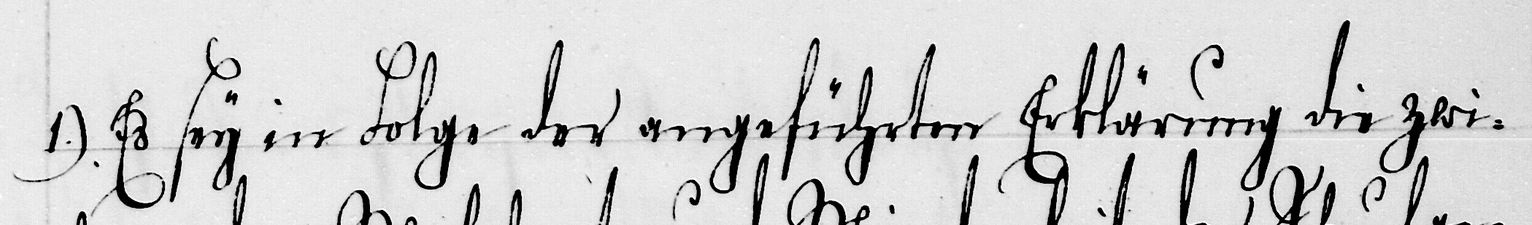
Es sey in Folge der angeführten Erklärung die zwi¬
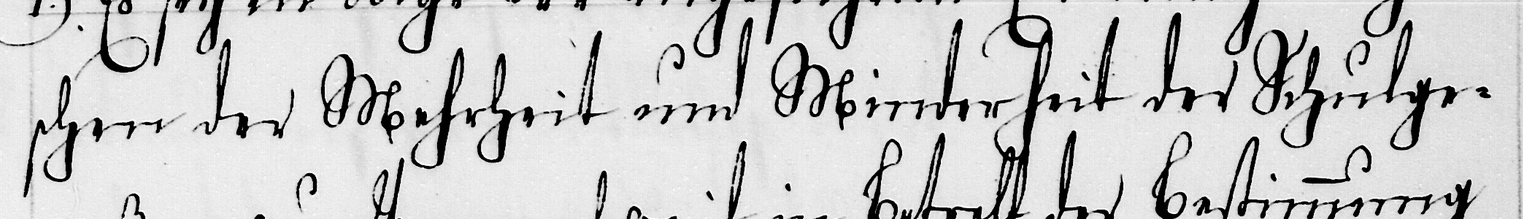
schen der Mehrheit und Minderheit der Schulge¬
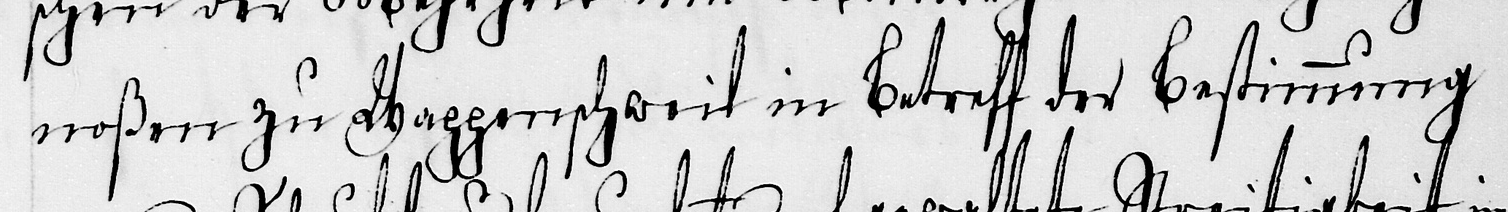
noßen zu Wappenschweil in Betreff der Bestimmung
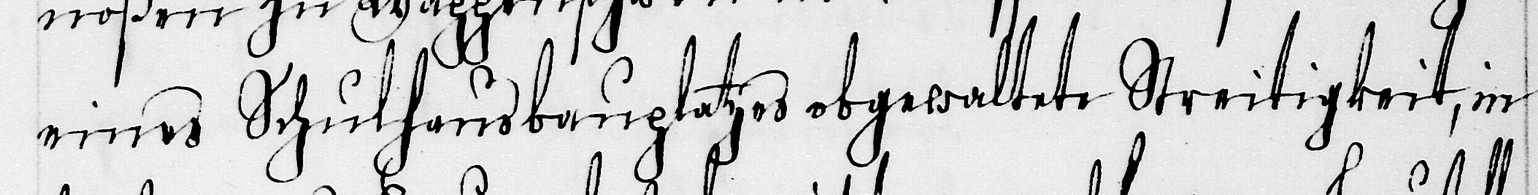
eines Schulhausbauplatzes obgewaltete Streitigkeit, in
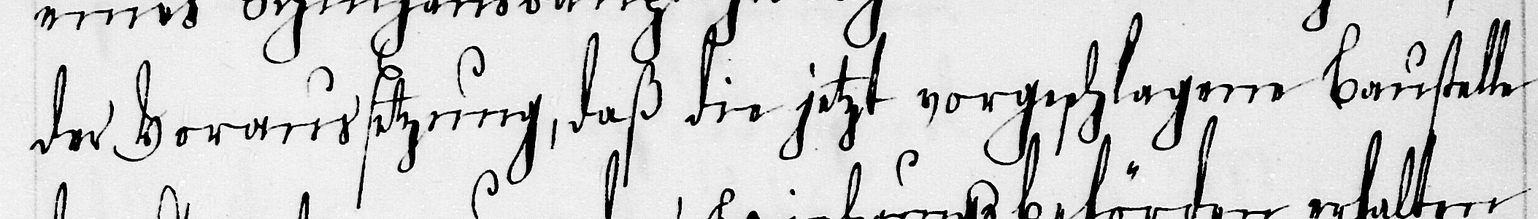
der Voraussetzung, daß die jetzt vorgeschlagene Baustelle
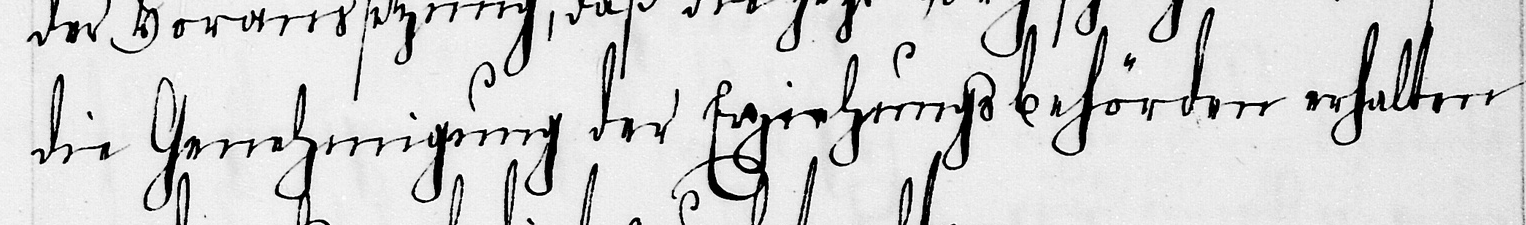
die Genehmigung der Erziehungsbehörden erhalten
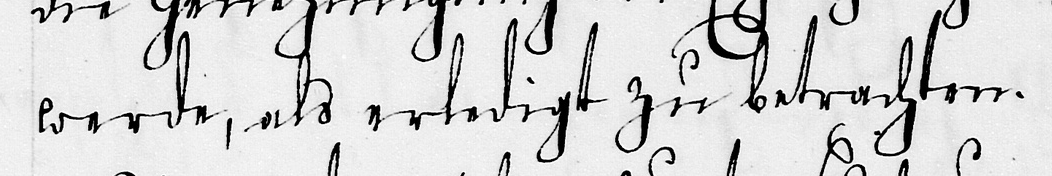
werde, als erledigt zu betrachten.
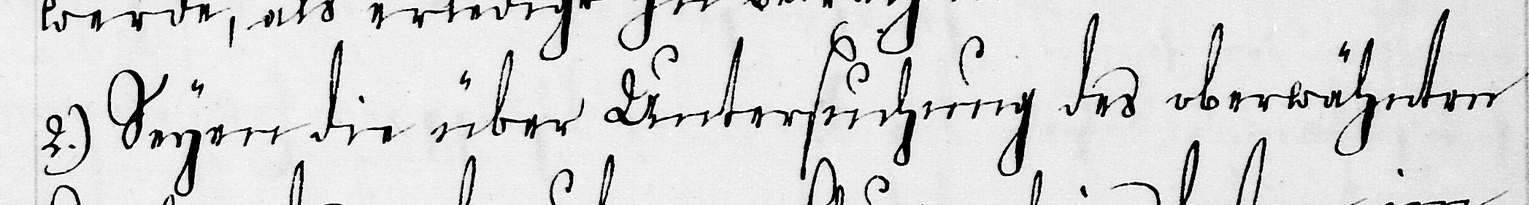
2.) Seyen die über Untersuchung des oberwähnten
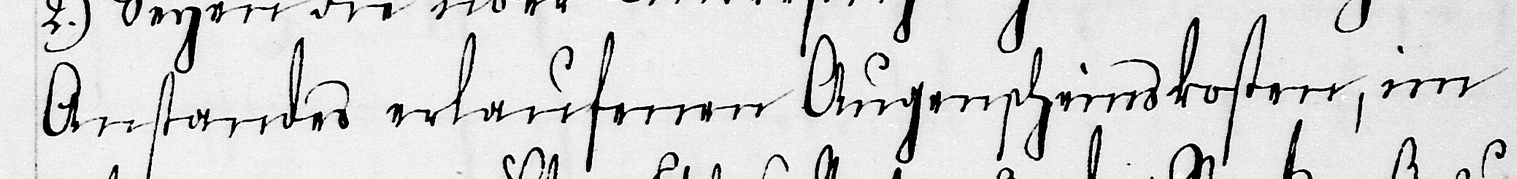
Anstandes erlaufenen Augenscheinskosten, im
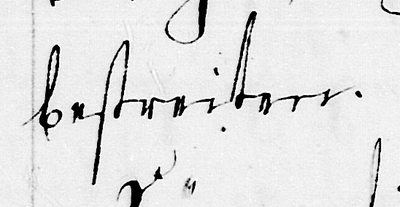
bestreiten.
